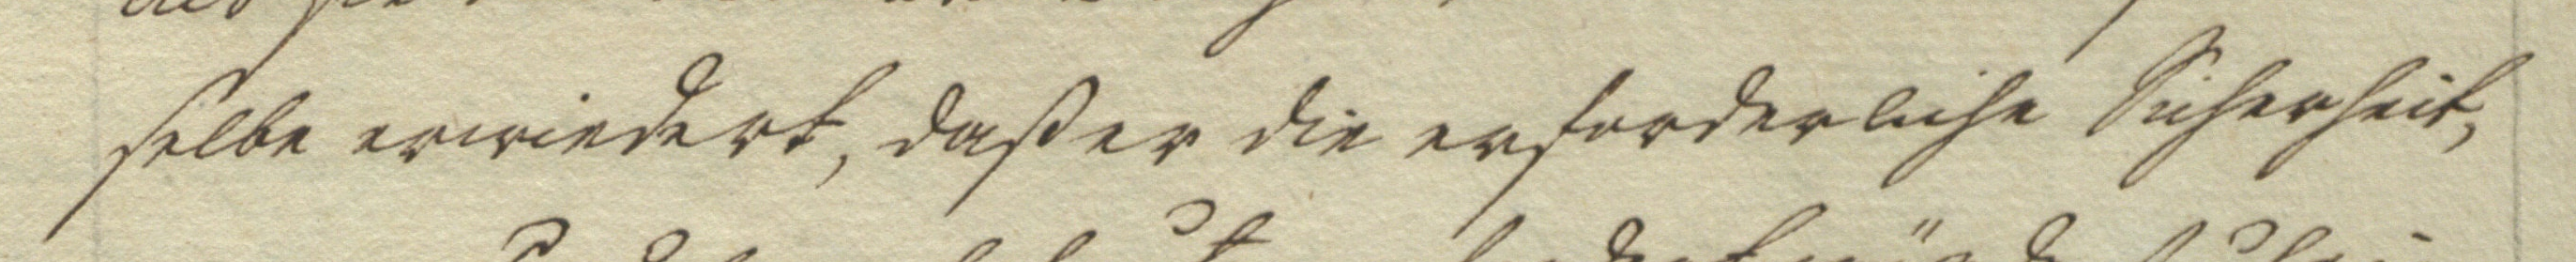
selbe erwiedert, daß er die erforderliche Sicherheit,
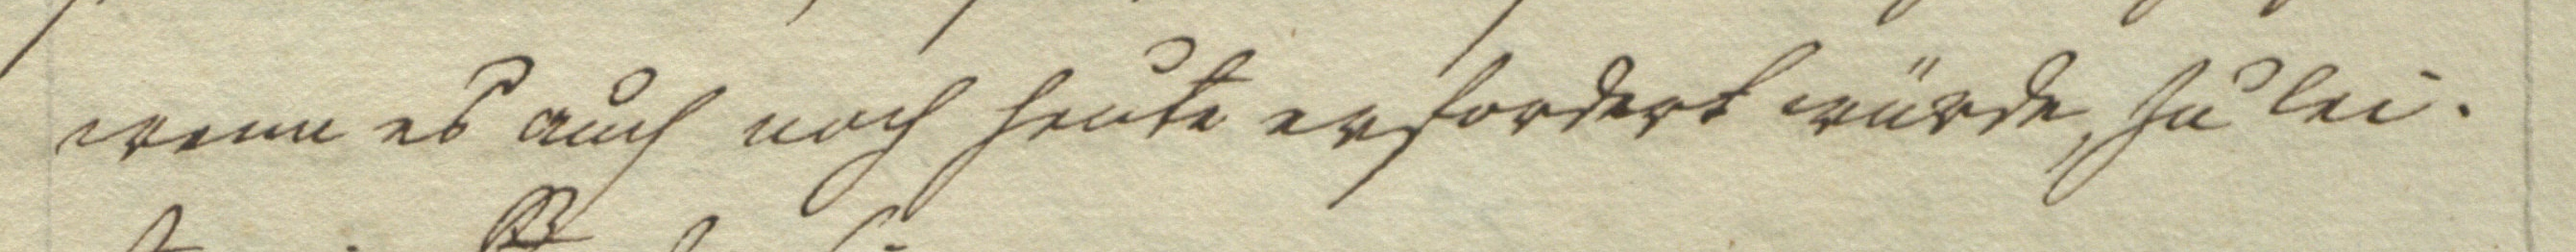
wenn es auch noch heute erfordert würde, zu lei¬
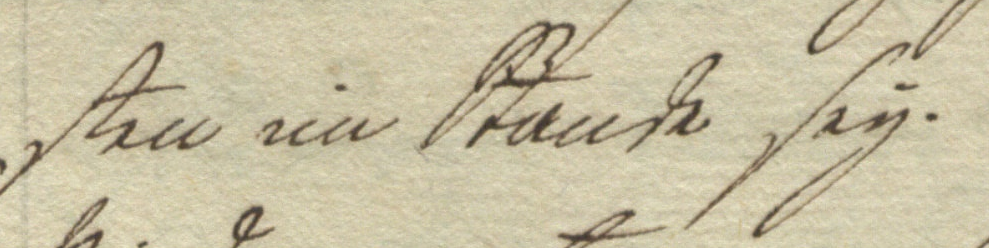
sten im Stande seÿ.
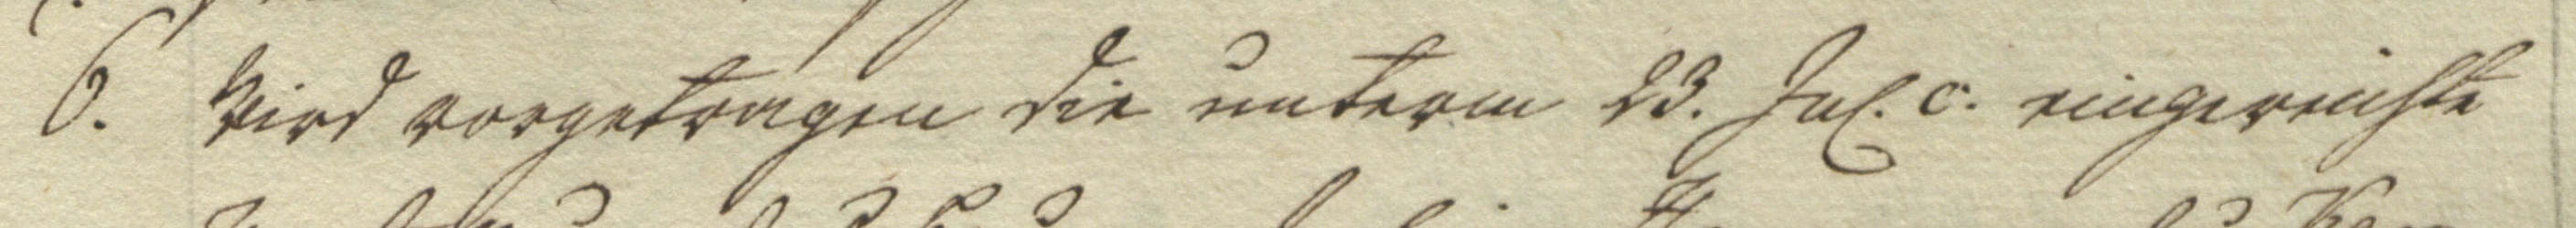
6. Wird vorgetragen die unterm 23. hoc. eingereichte
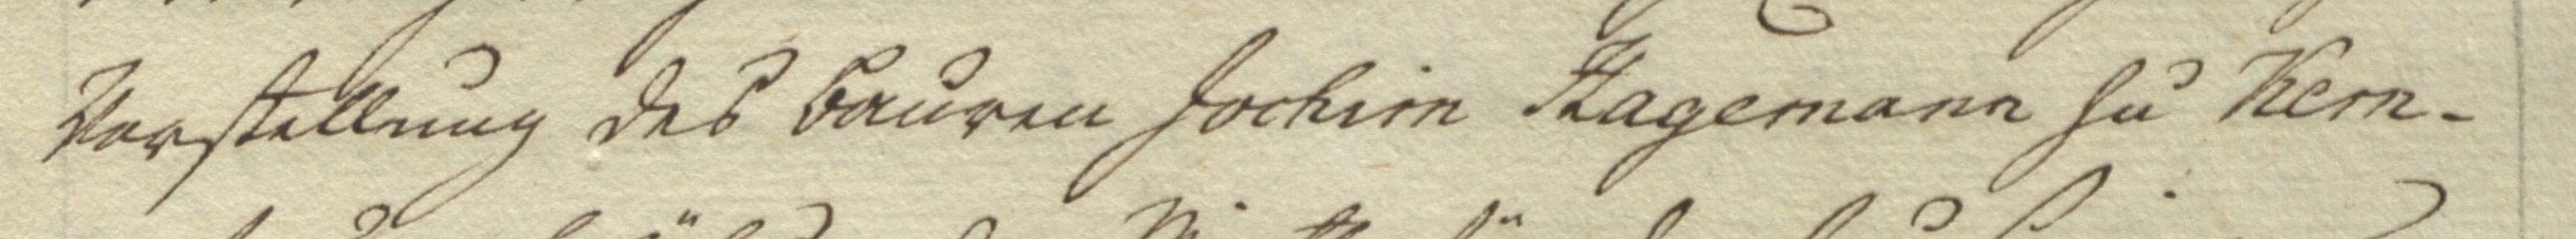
Vorstellung des Bauren Jochim Hagemann zu Kem¬
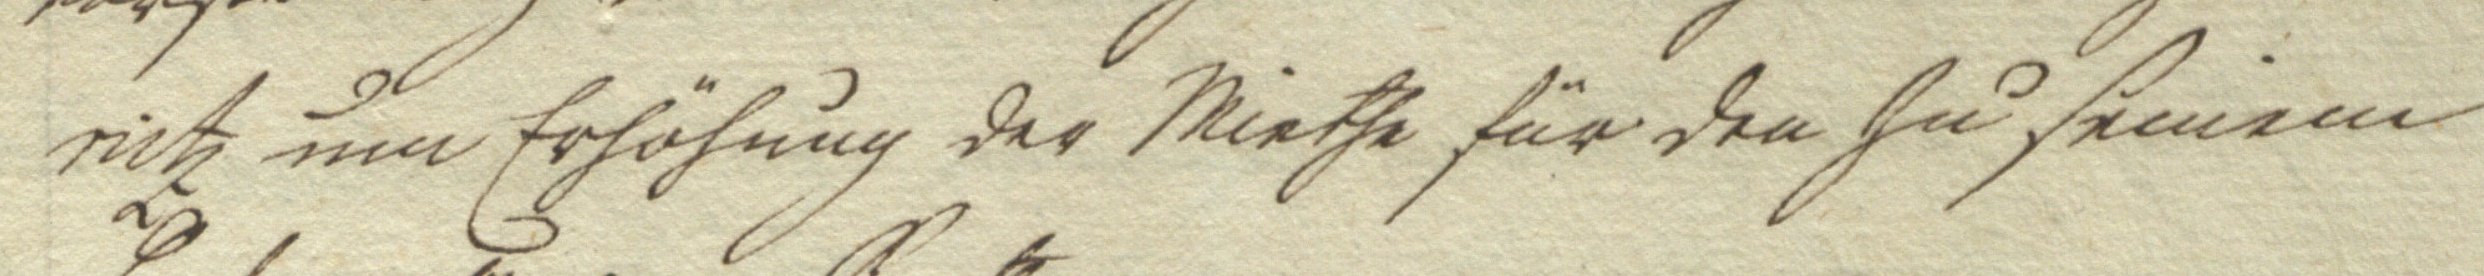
nitz um Erhöhung der Miethe für den zu seinem
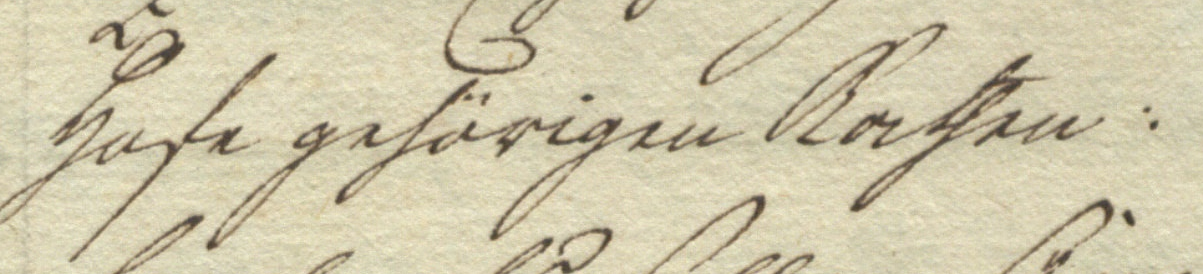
Hofe gehörigen Kathen:
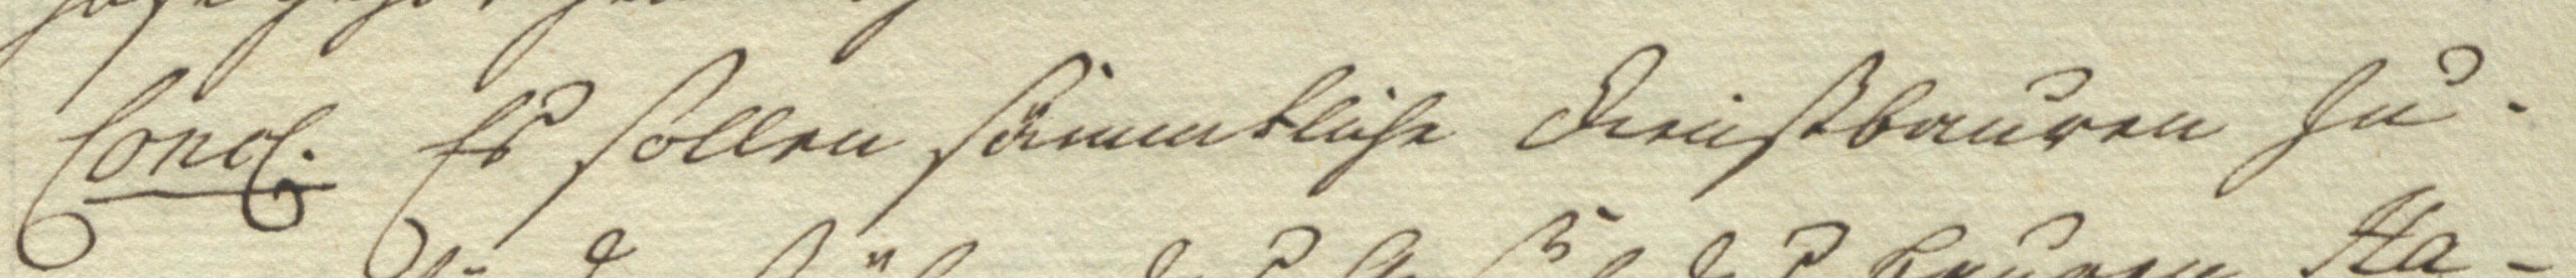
Concl. Es sollen sämmtliche Dienstbauren zu¬
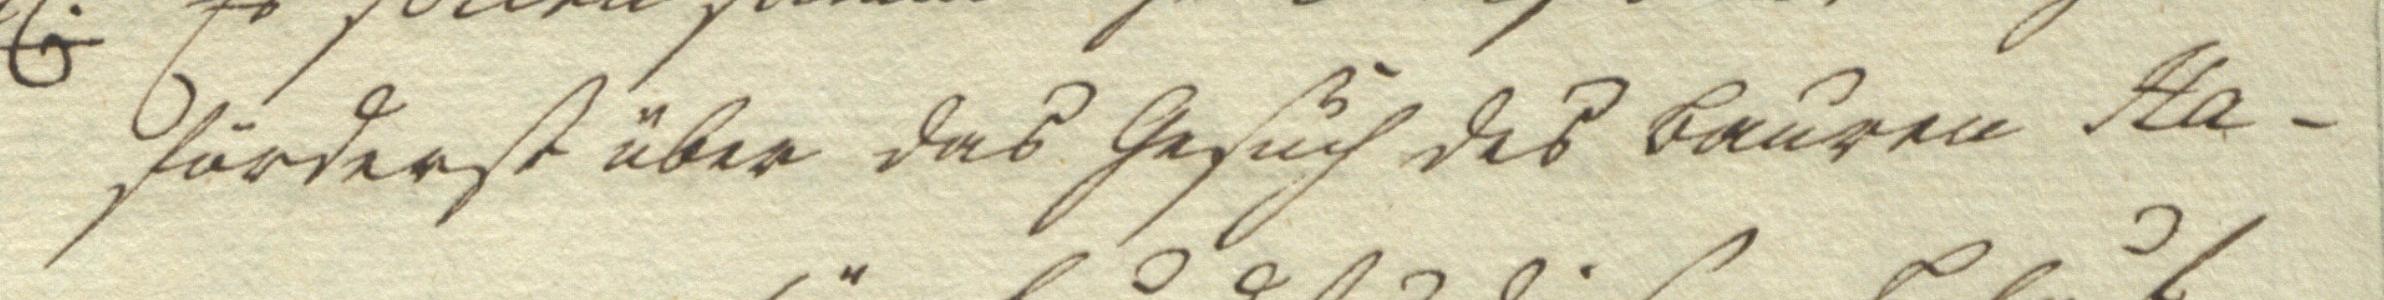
förderst über das Gesuch des Bauren Ha¬
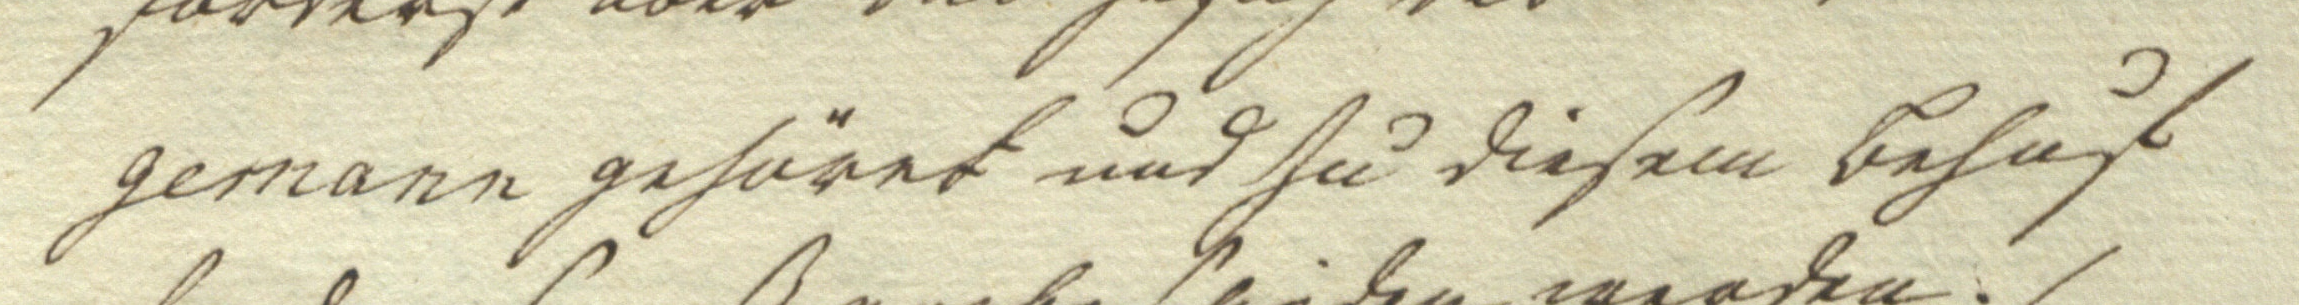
gemann gehöret und zu diesem Behuf
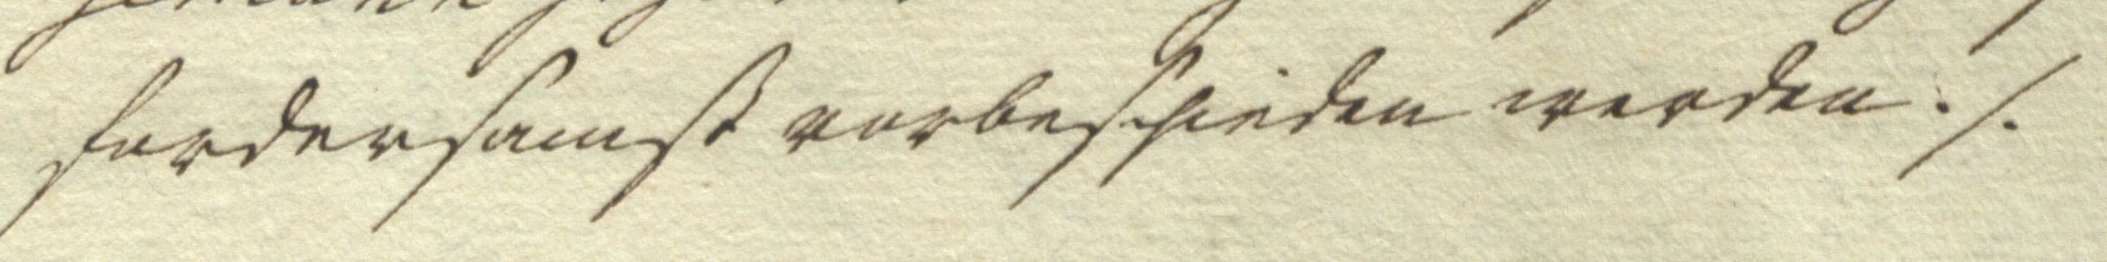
fordersamst vorbeschieden werden. /.
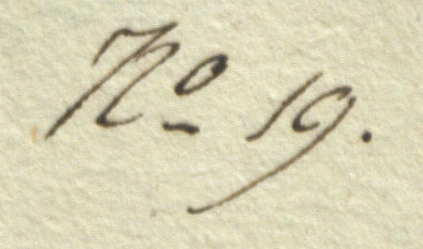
No 19.
